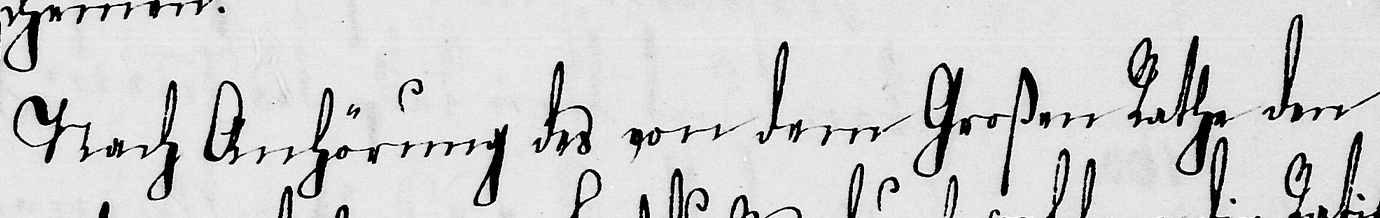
Nach Anhörung des von dem Großen Rathe den
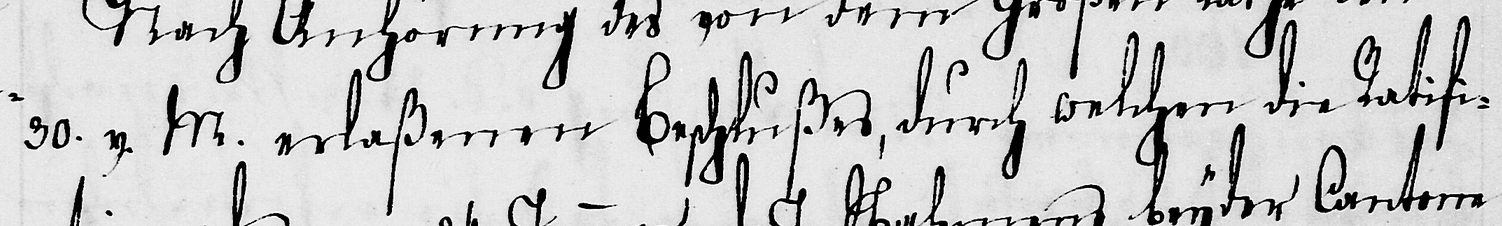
30. v. M. erlaßenen Beschlußes, durch welchen die Ratif¬
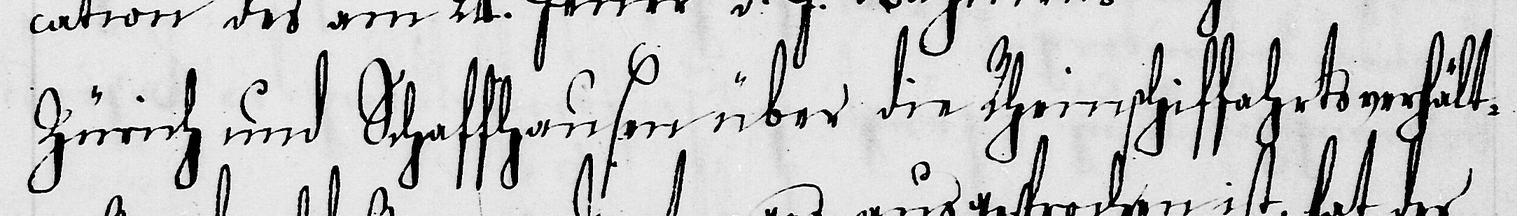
Zürich und Schaffhausen über die Rheinschiffahrtsverhäl¬
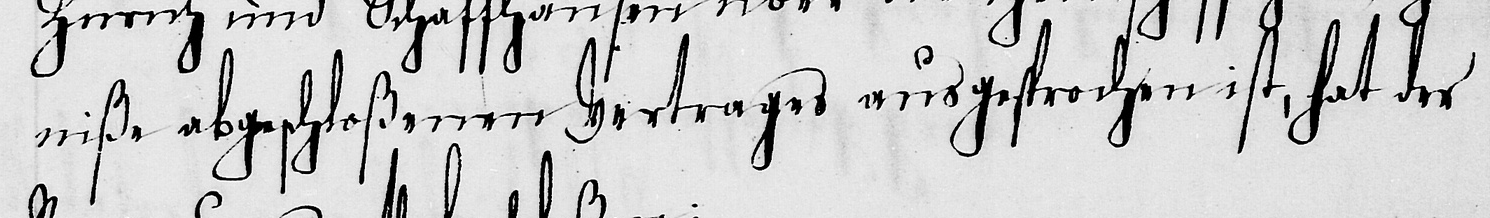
tniße abgeschloßenen Vertrages ausgesprochen ist, hat der
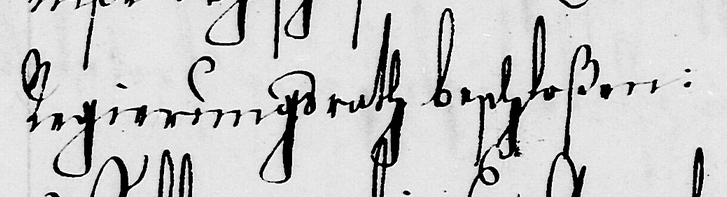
Regierungsrath beschloßen:
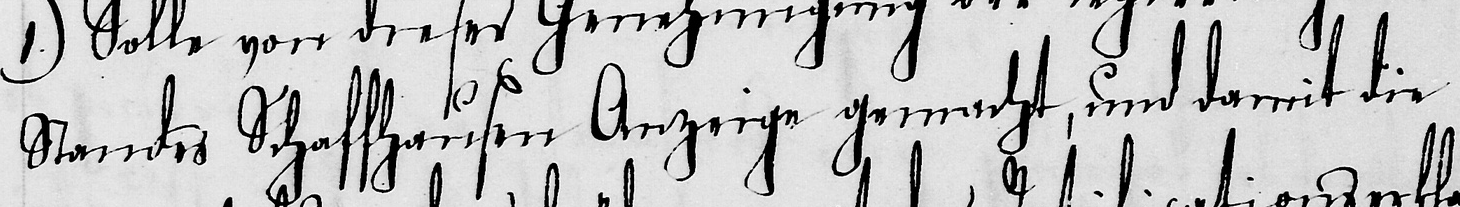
Standes Schaffhausen Anzeige gemacht, und damit die
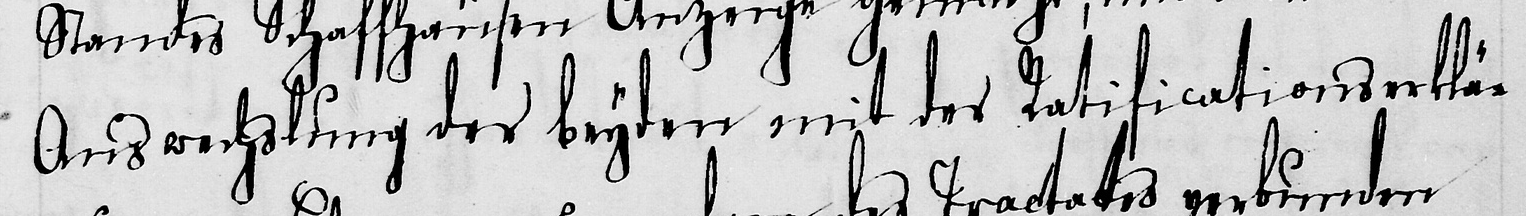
Auswechslung der beyden mit der Ratificationserklä¬
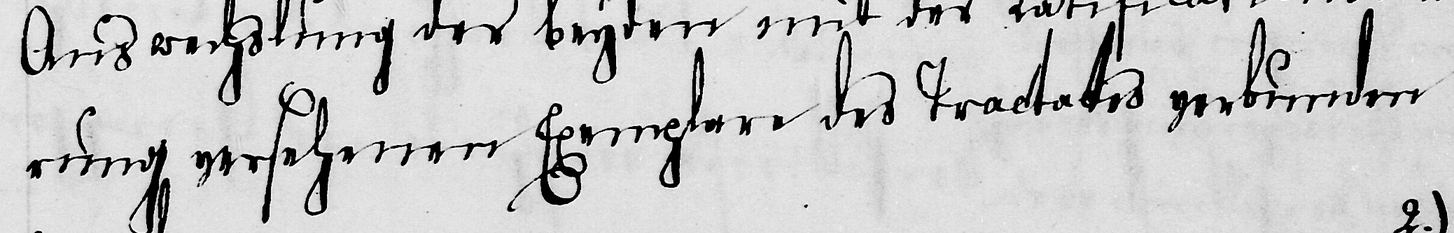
rung versehenen Exemplare des Tractates verbunden
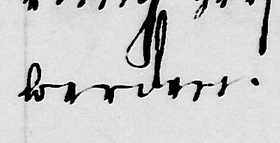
werden.
